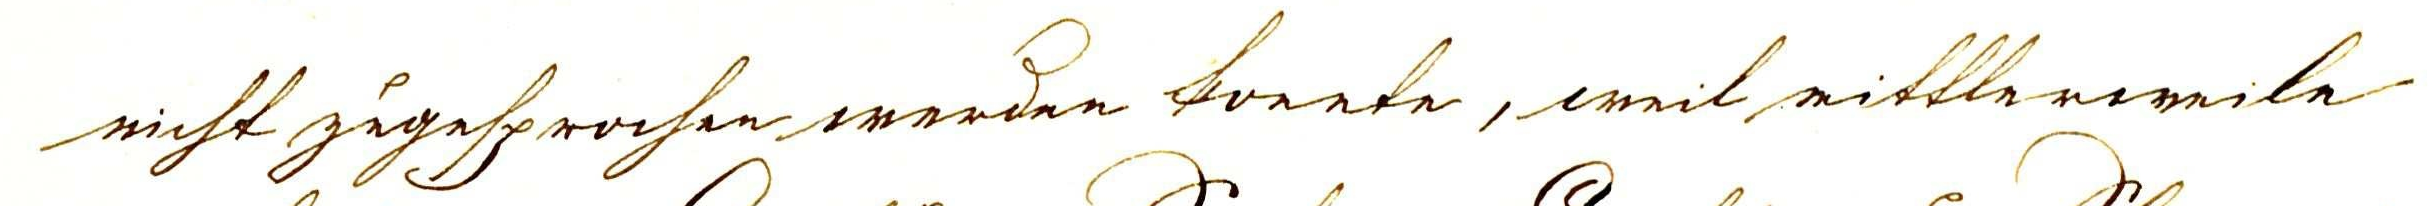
nicht zugesprochen werden konnte, weil mittlerweile
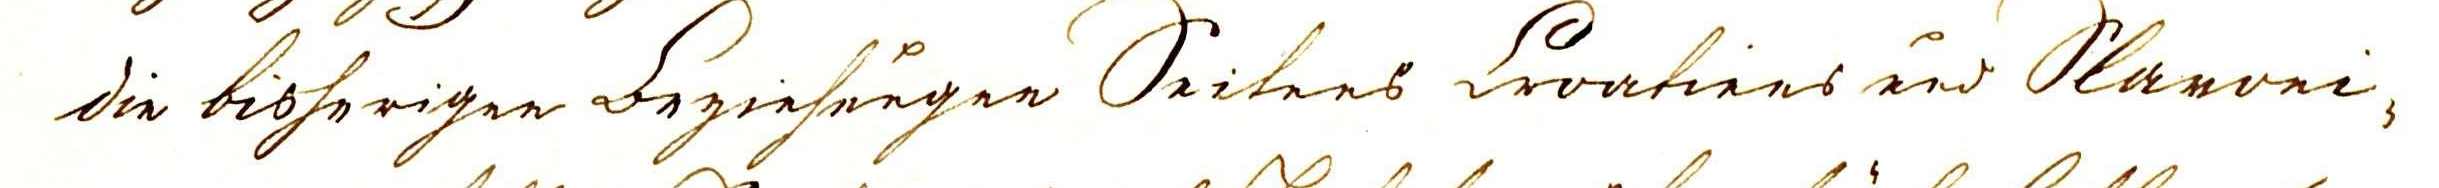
die bisherigen Beziehungen Seitens Croatiens und Slavoni¬
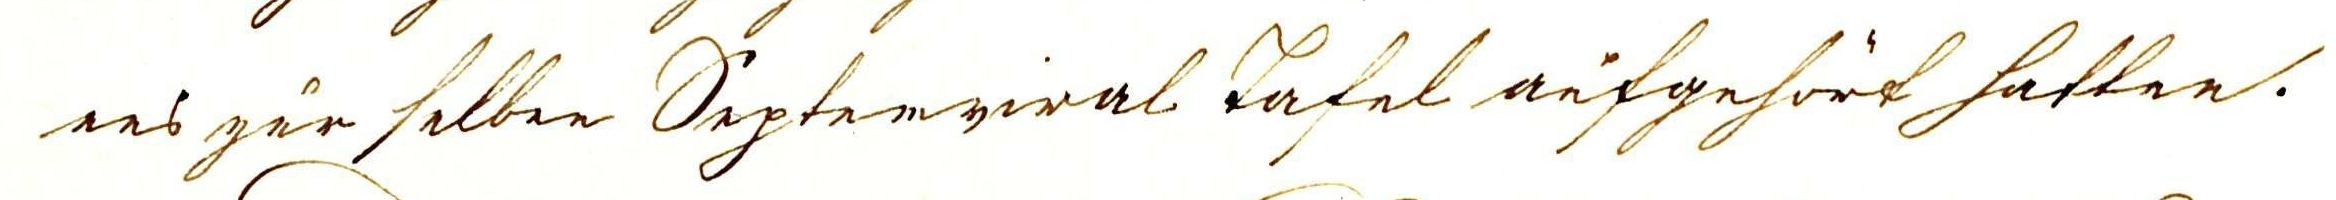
ens zur selben Septemviral Tafel aufgehört hatten.
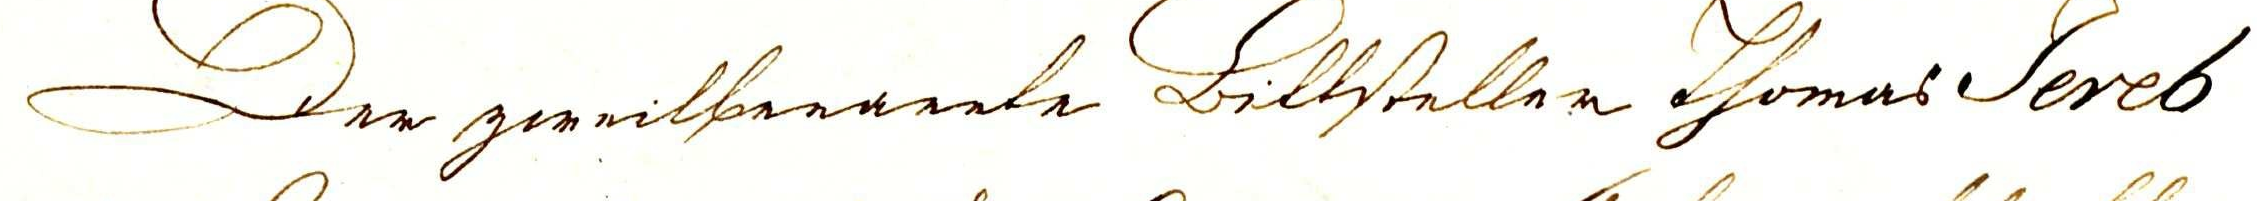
Der Zweitbenannte Bittsteller Thomas Jereb
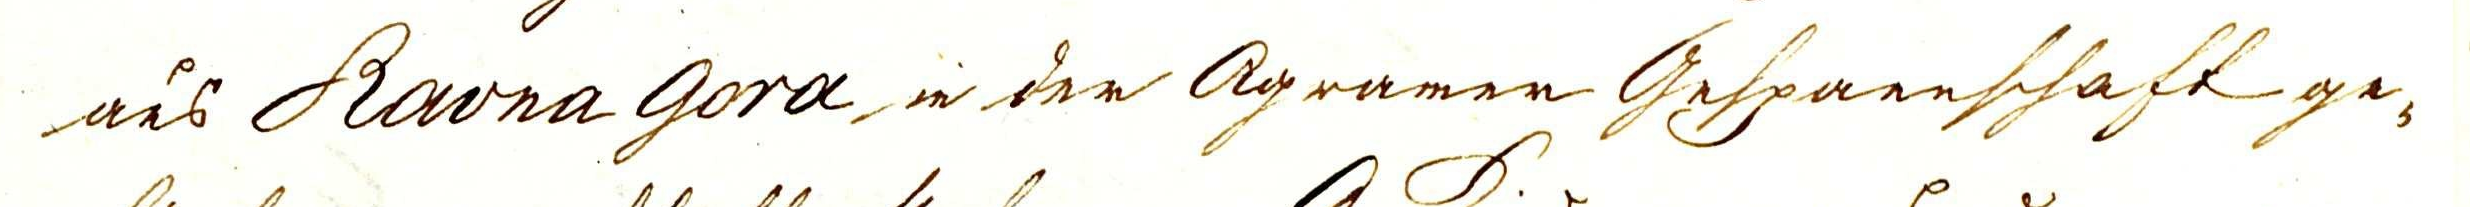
aus Ravna Gora in der Agramer Gespannschafth ge¬
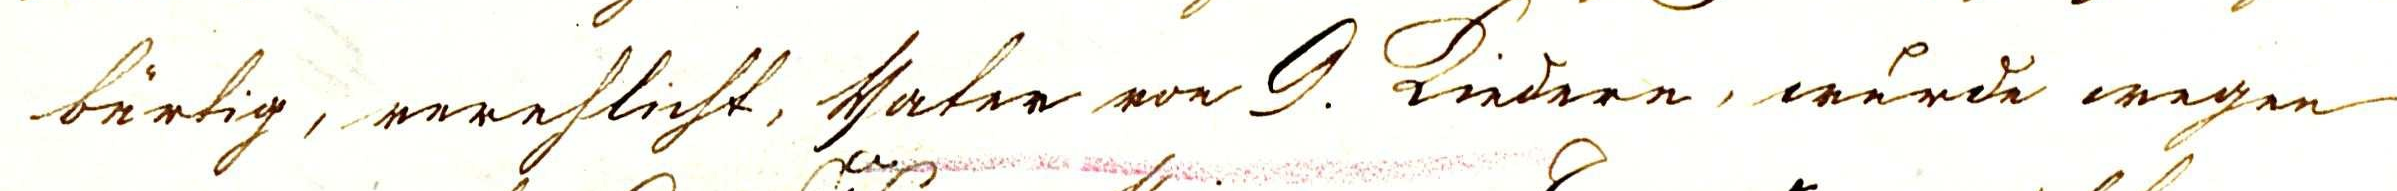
bürtig, verehlicht, Vater von 9. Kindern, wurde wegen
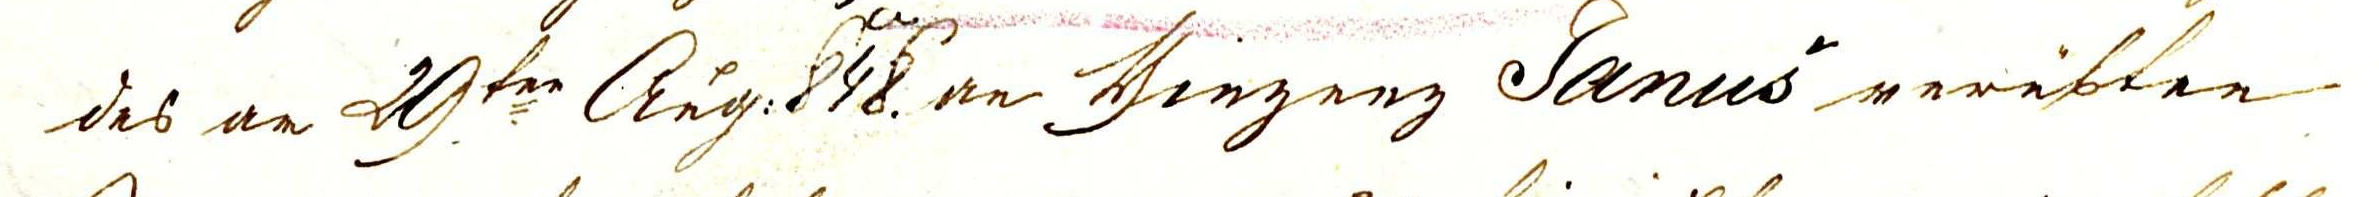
des am 29ten Aug. 1848 an Vinzenz Januš verübten
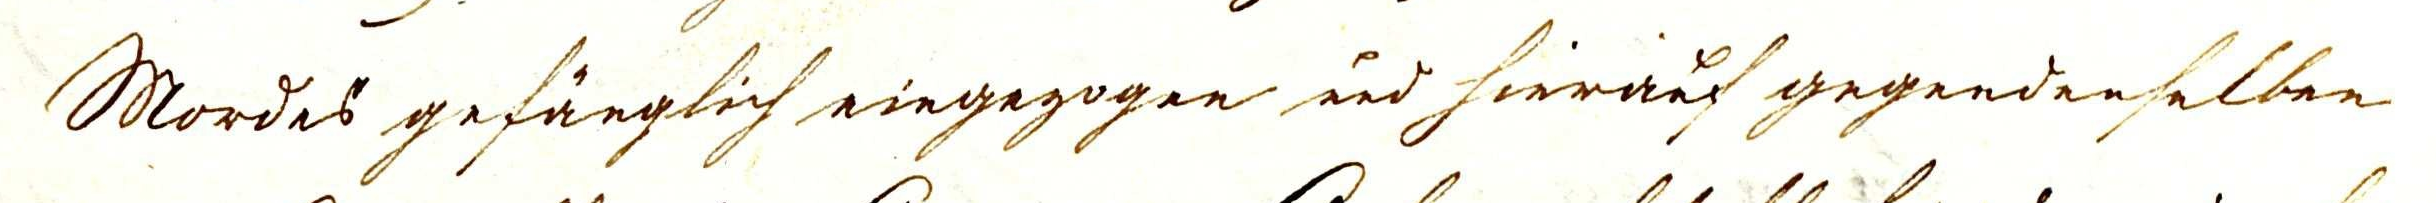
Mordes gefänglich eingezogen und hierauf gegendenselben
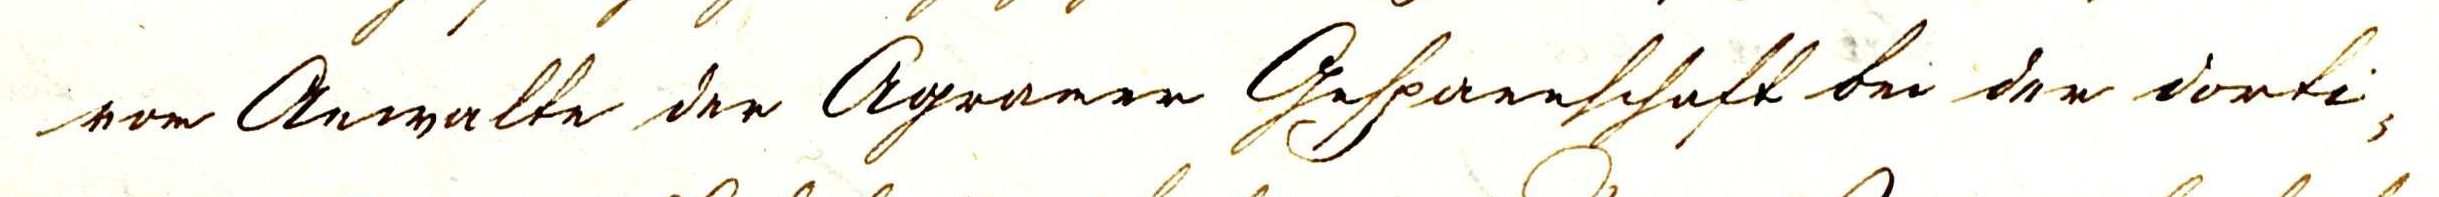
vom Anwalte der Agramer Gespannschaft der dorti¬
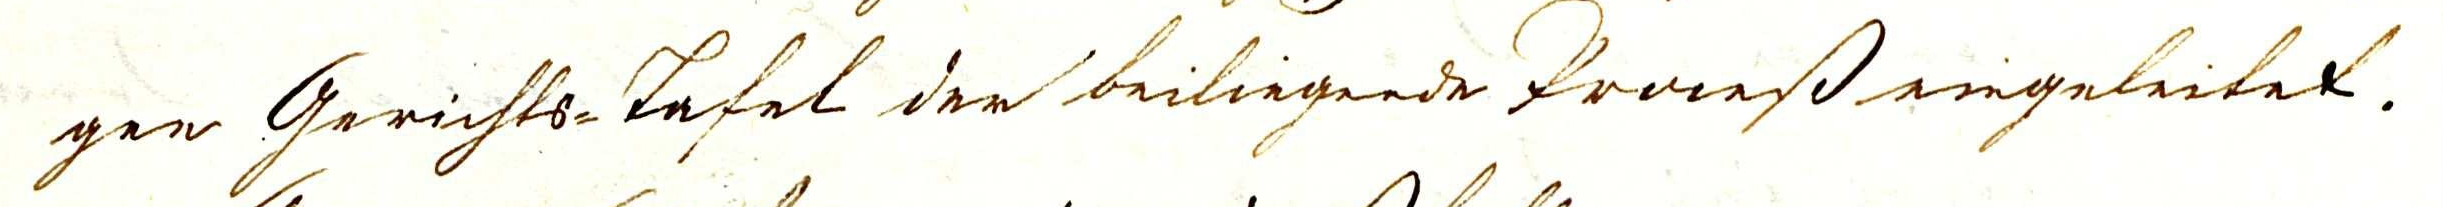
gen Gerichts-Tafel der beiliegende Proceß eingeleitet.
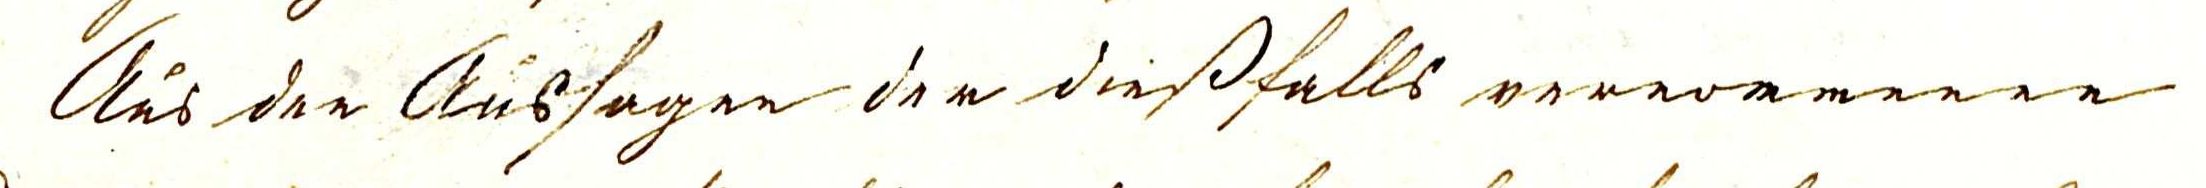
Aus der Auslagen der dießfalls vernommenen
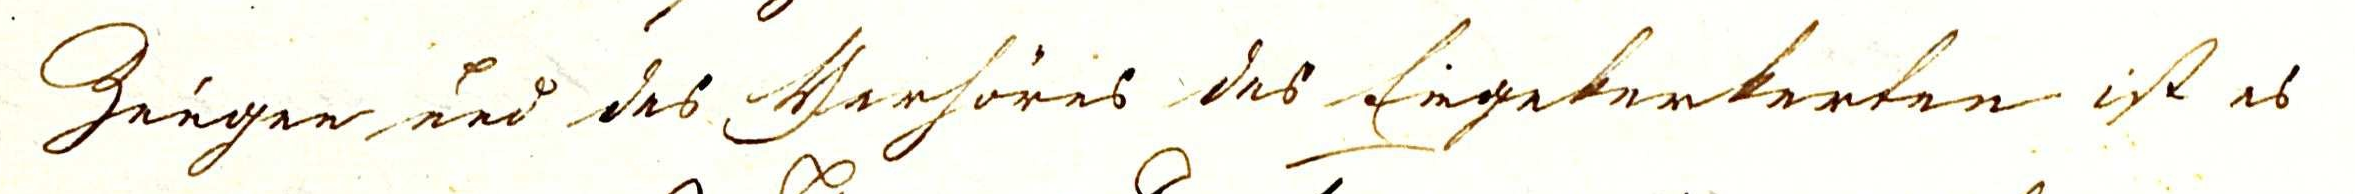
Zeugen und des Verhöres des Eingekerkerten ist es
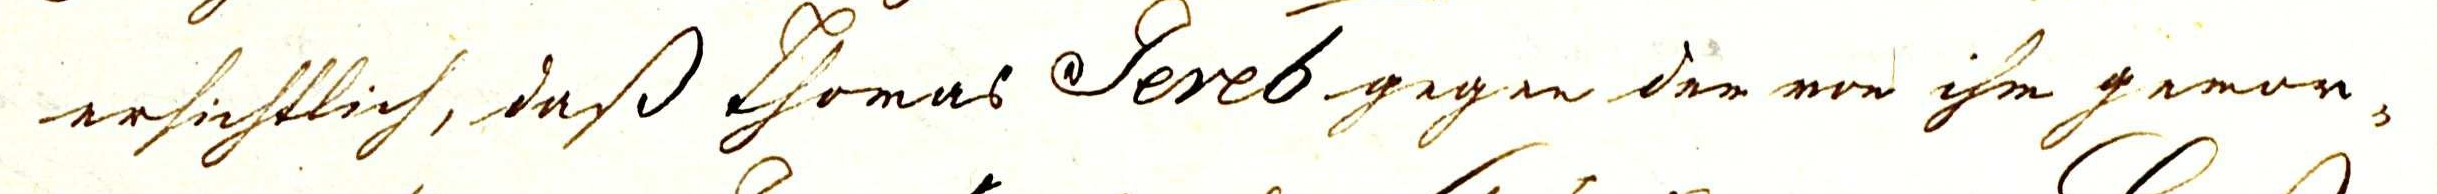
ersichtlich, daß Thomas Jereb gegen den von ihm gemor¬
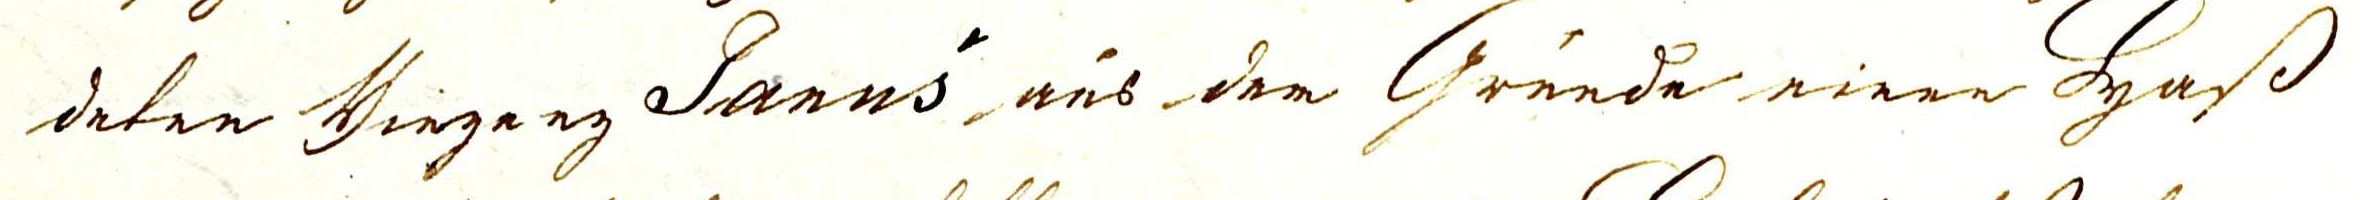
deten Vinzen Januš aus dem Gründe einer Haß
